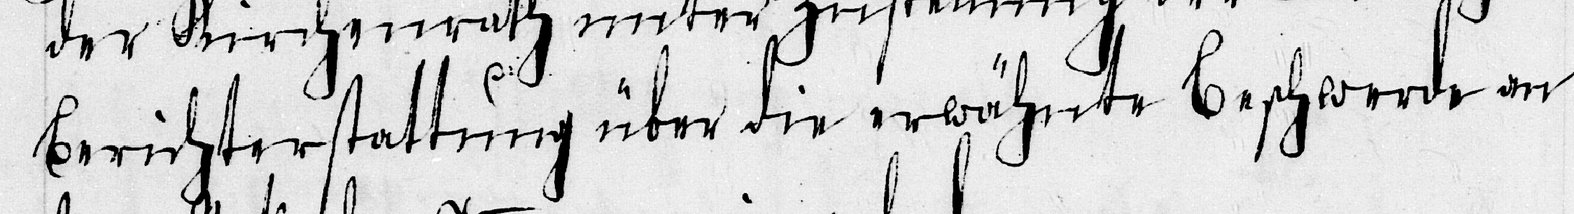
Berichterstattung über die erwähnte Beschwerde an
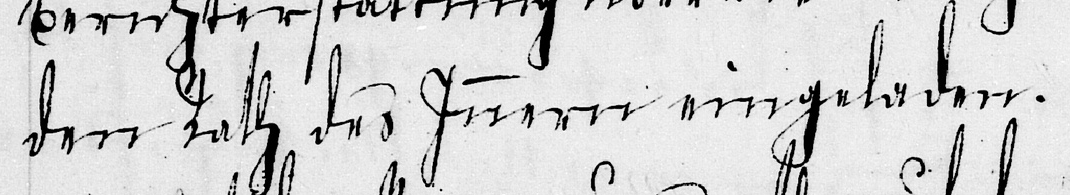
den Rath des Innern eingeladen.
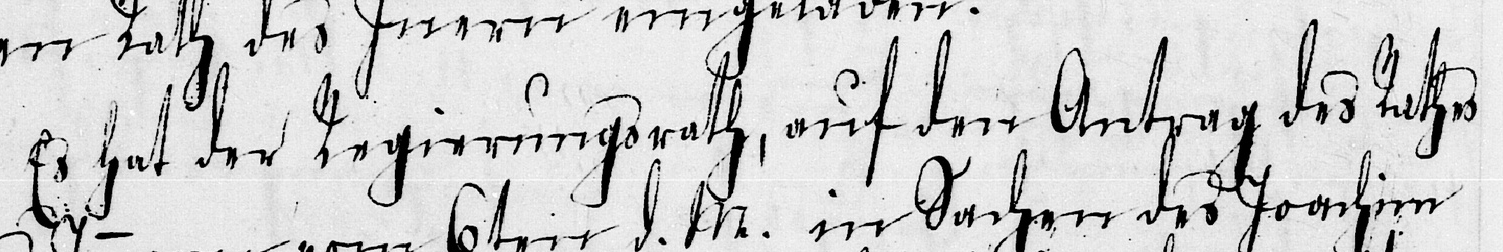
Es hat der Regierungsrath, auf Antrag des Rathes
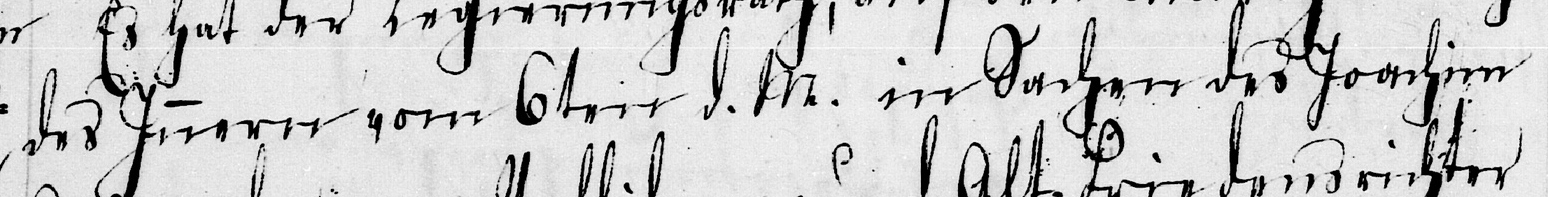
des Innern vom 6ten d. M. in Sachen des Joachim
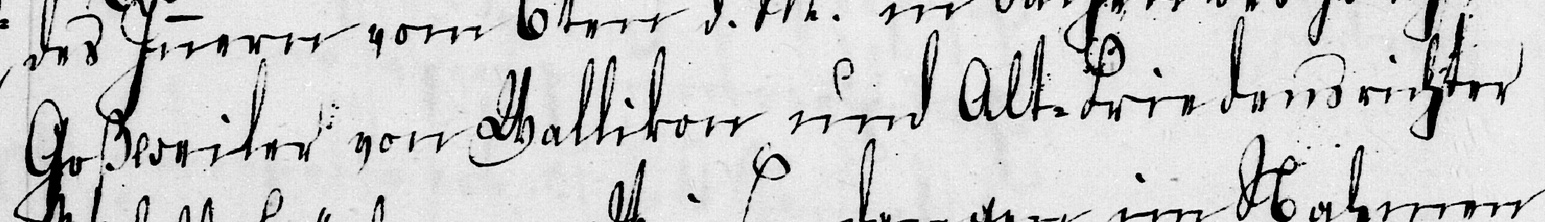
Goßweiler von Wallikon und Alt-Friedensrichter
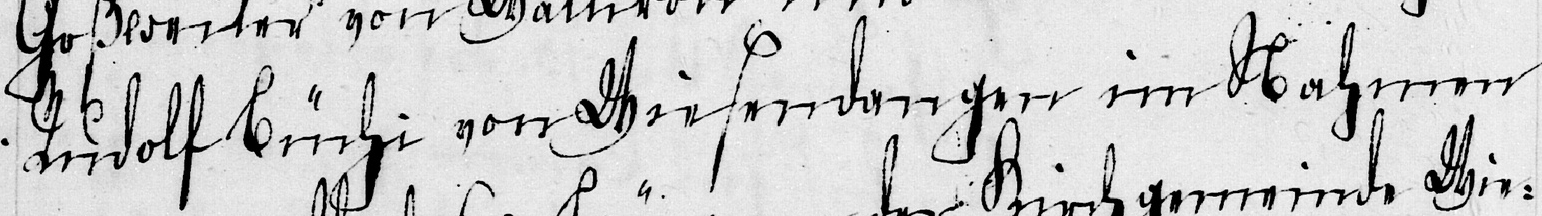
Rudolf Büchi von Wiesendangen im Nahmen
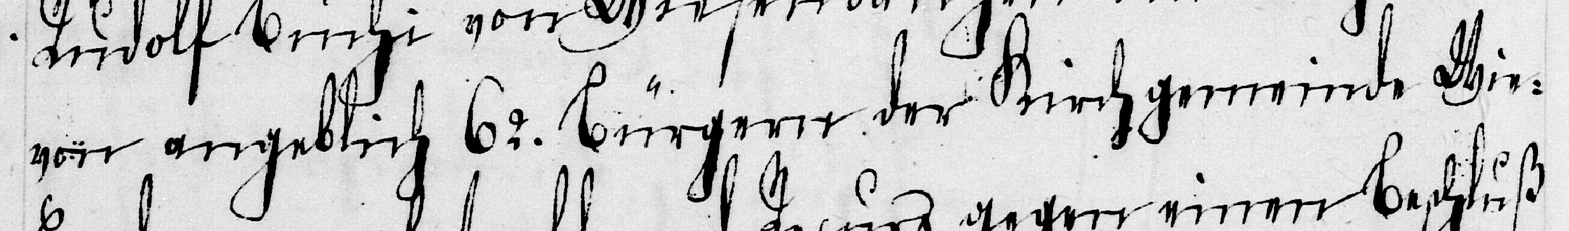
von angeblich 62. Bürgern der Kirchgemeinde Wie¬
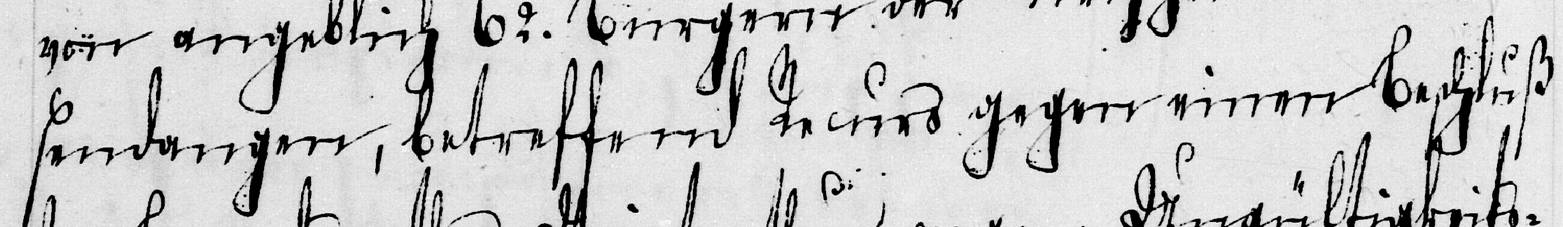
sendangen, betreffend Recurs gegen einen Beschluß
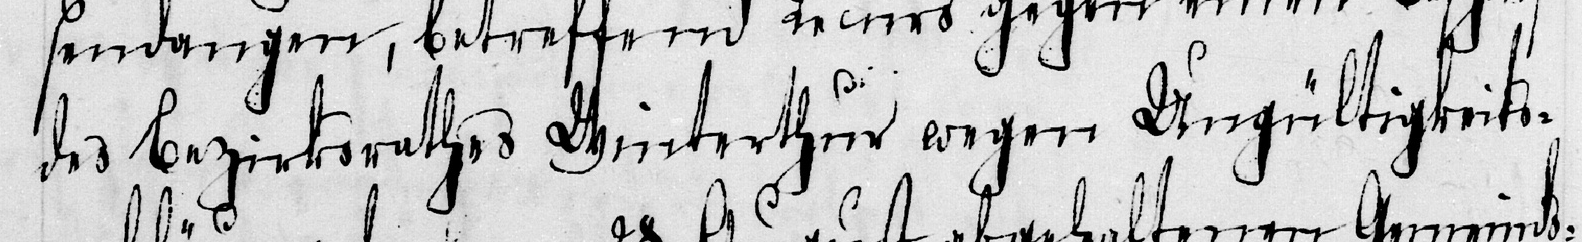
des Bezirksrathes Winterthur wegen Ungültigkeits¬
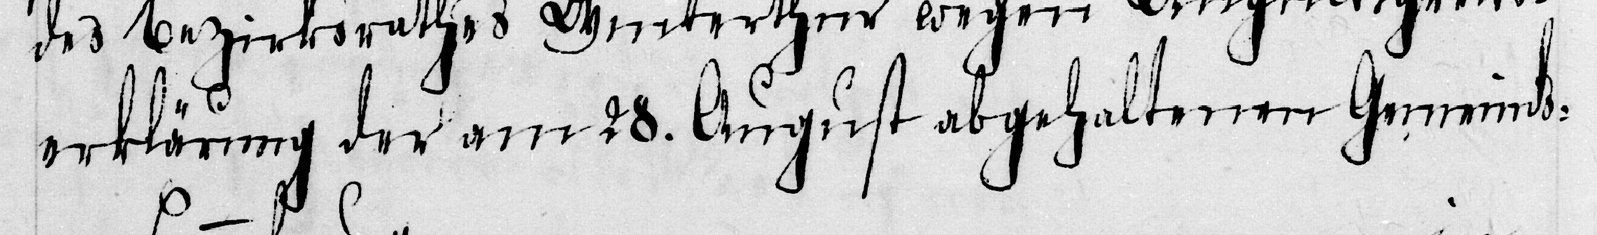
erklärung der am 28. August abgehaltenen Gemeinds¬
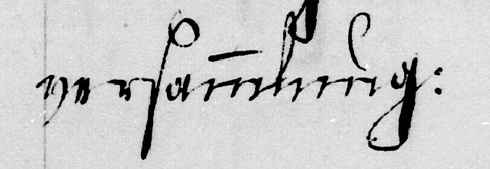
versammlung:
